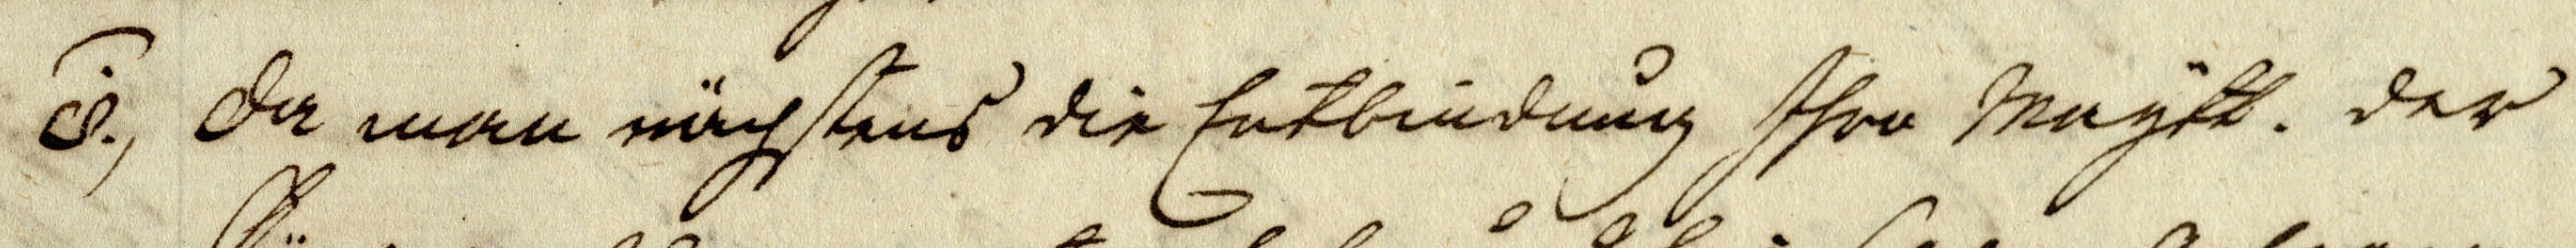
8., Da man nächstens die Entbindung Ihro Maÿtt. der
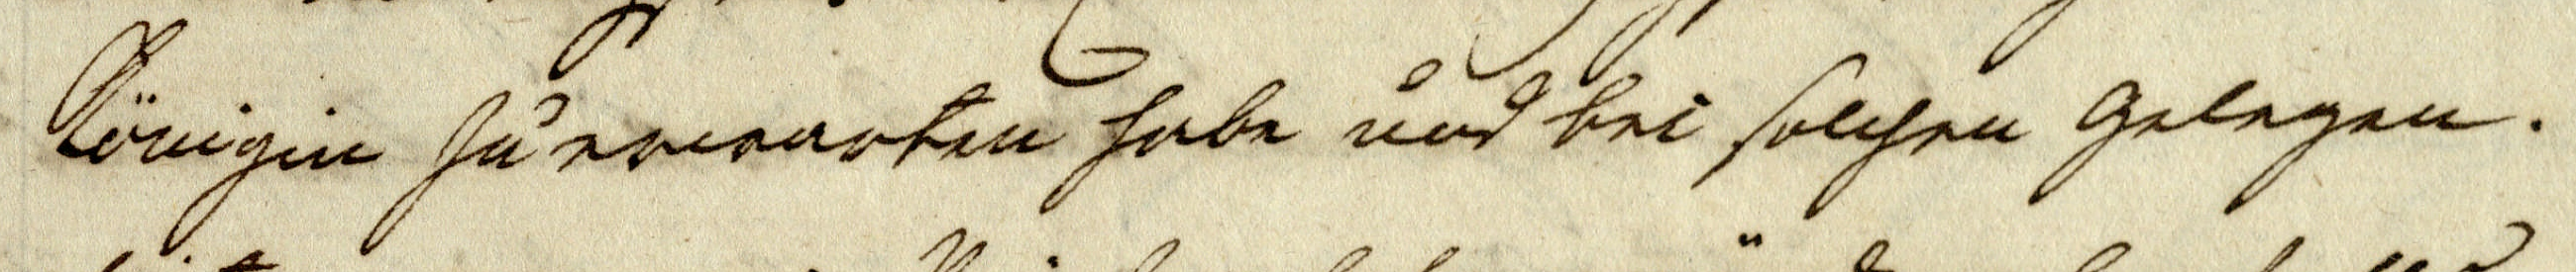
Königin zu erwarten habe und bei solchen Gelegen¬
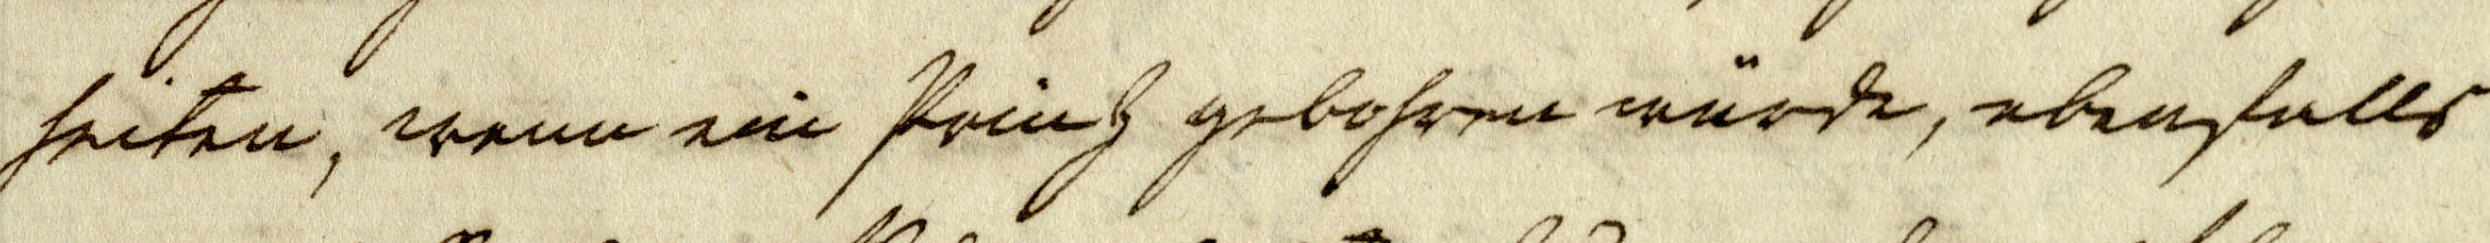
heiten, wenn ein Prinz gebohren würde, ebenfalls
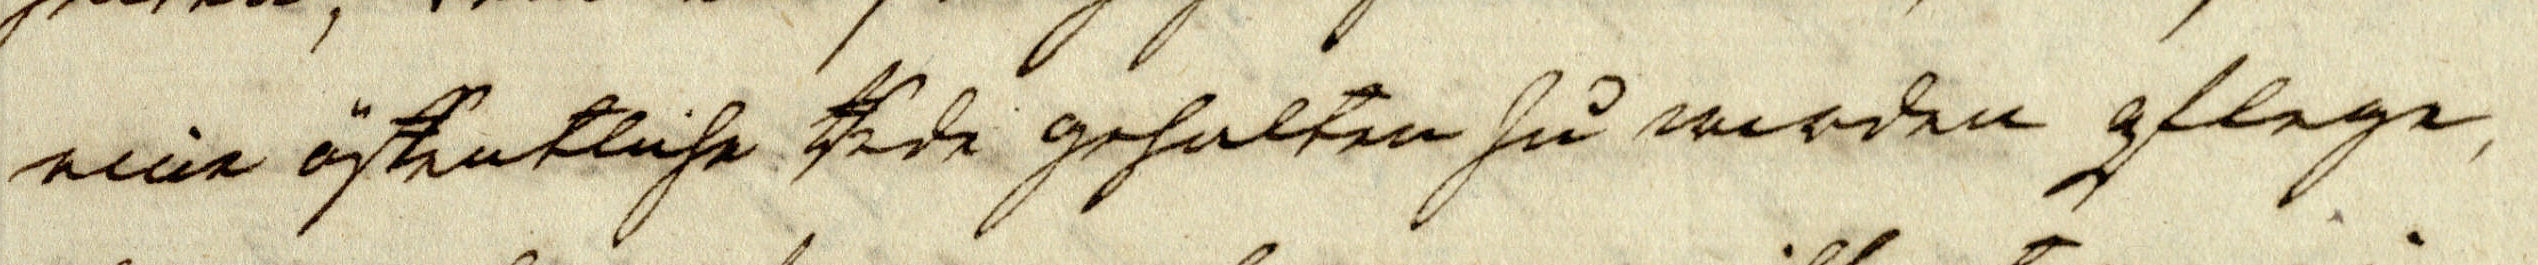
eine öffentliche Rede gehalten zu werden pflege,
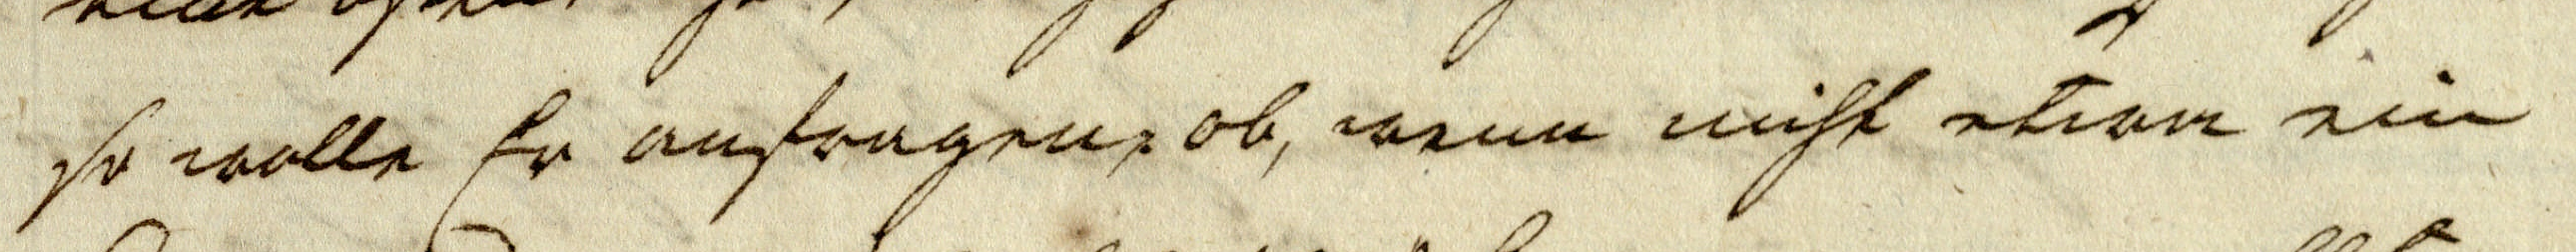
so wolle Er anfragen ob, wenn nicht etwa ein
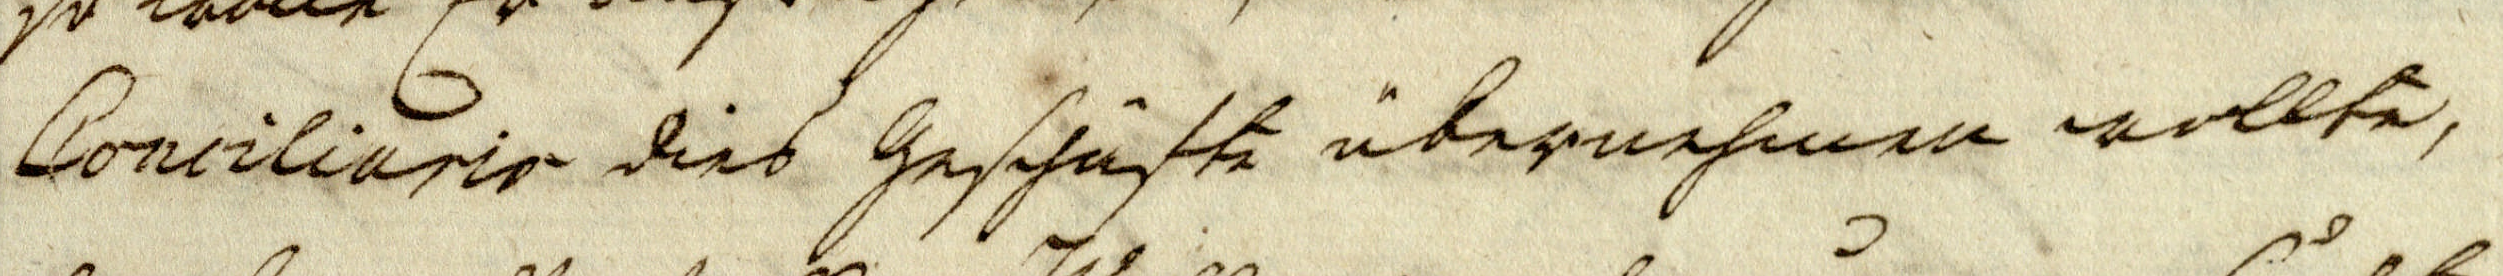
Conciliaris dies Geschäfte übernehmen wollte,
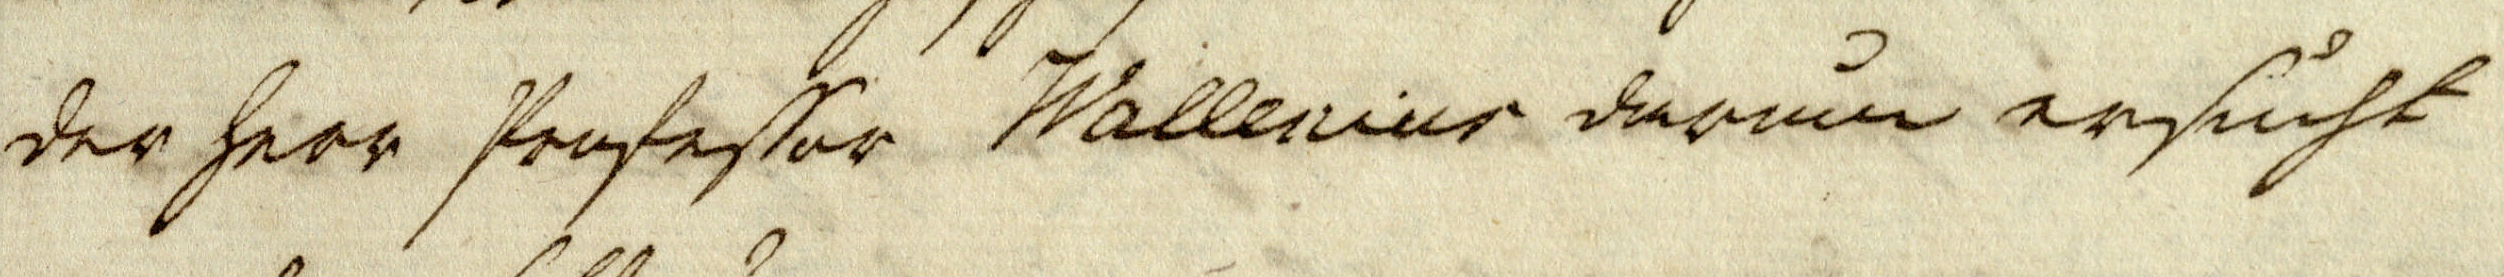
der Herr Professor Wallenius darum ersucht
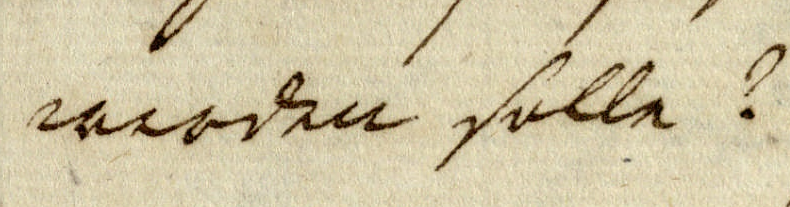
werden solle?
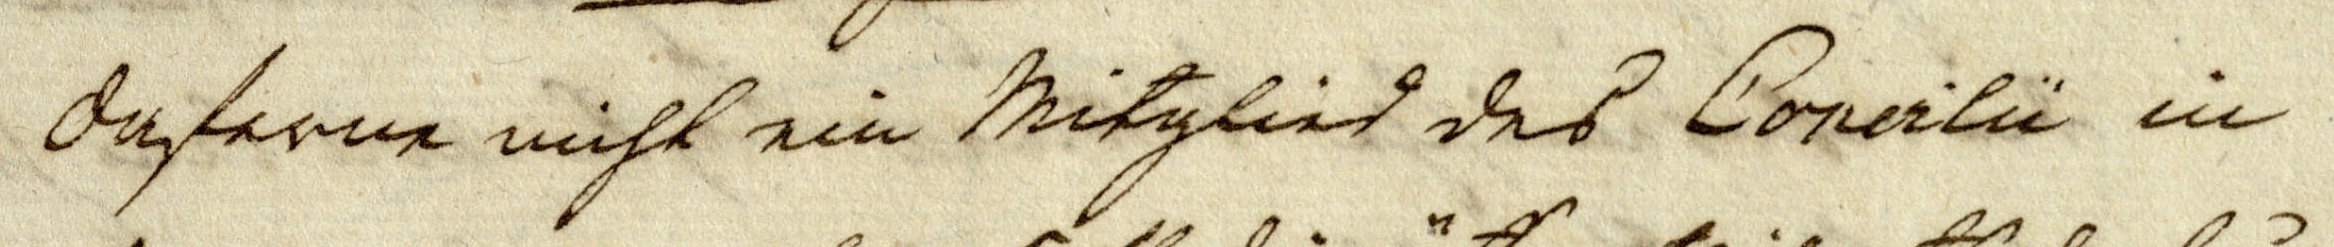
Daferne nicht ein Mitglied des Concilii in
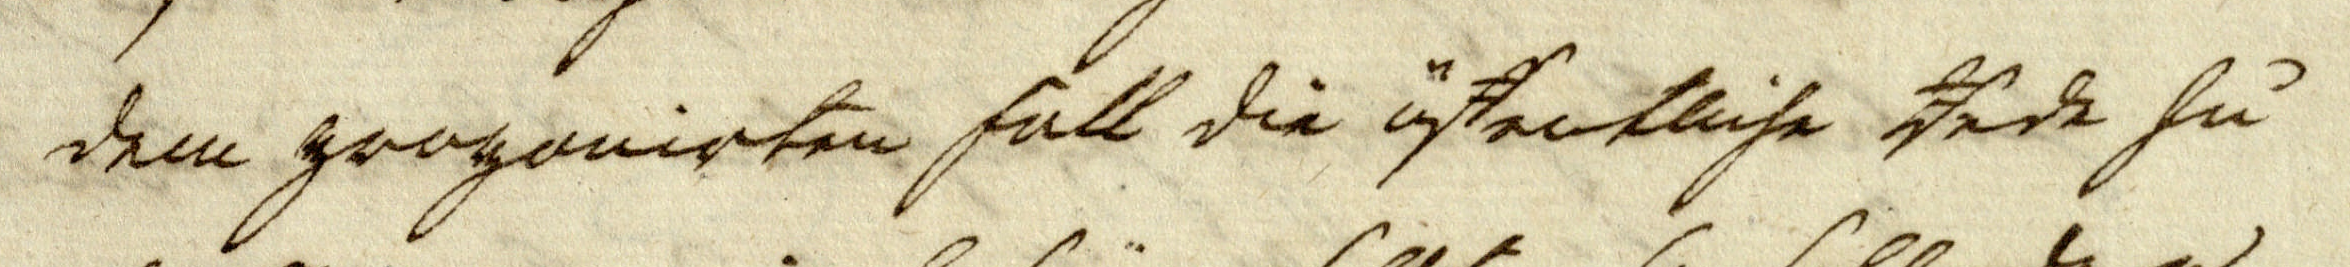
dem proponirten Fall die öffentliche Rede zu
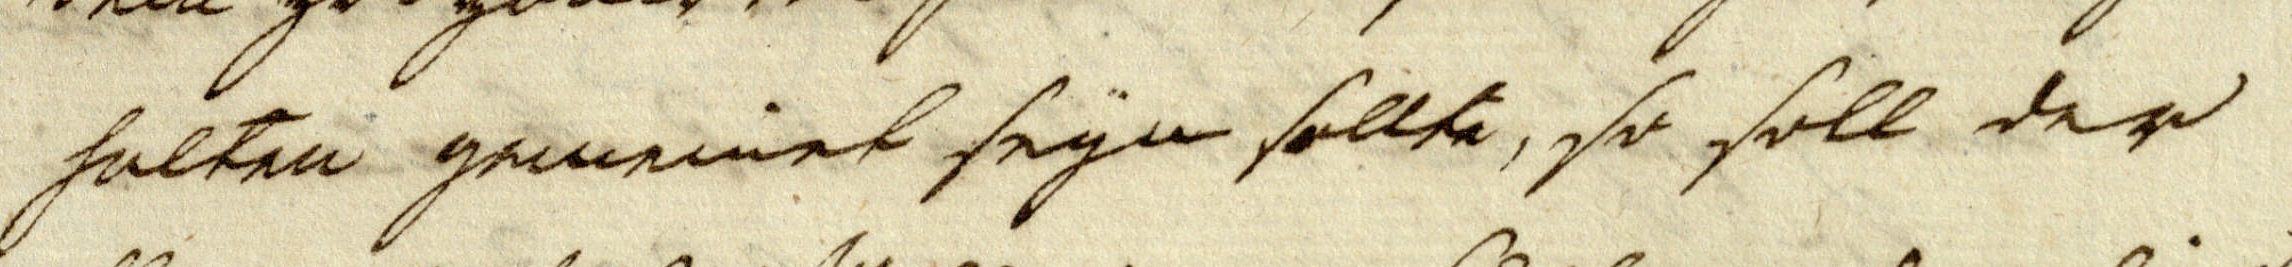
halten gemeinet seÿn sollte, so soll der
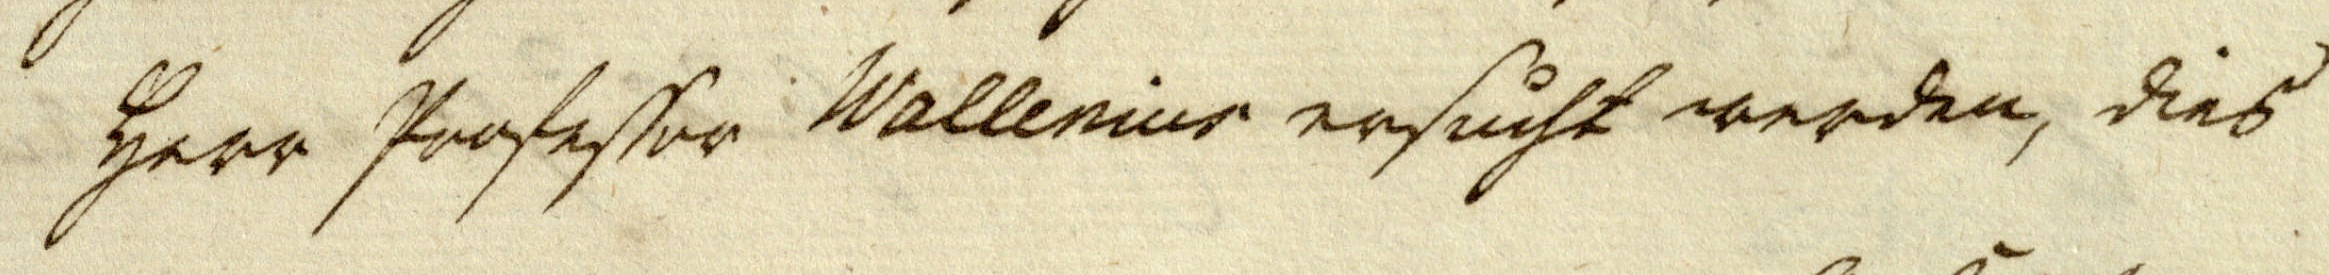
Herr Professor Wallenius ersucht werden, dies
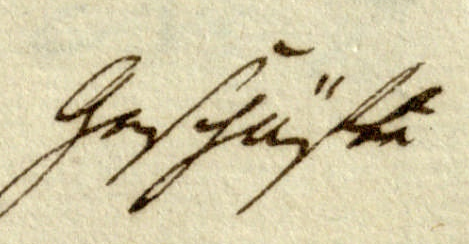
Geschäfte
